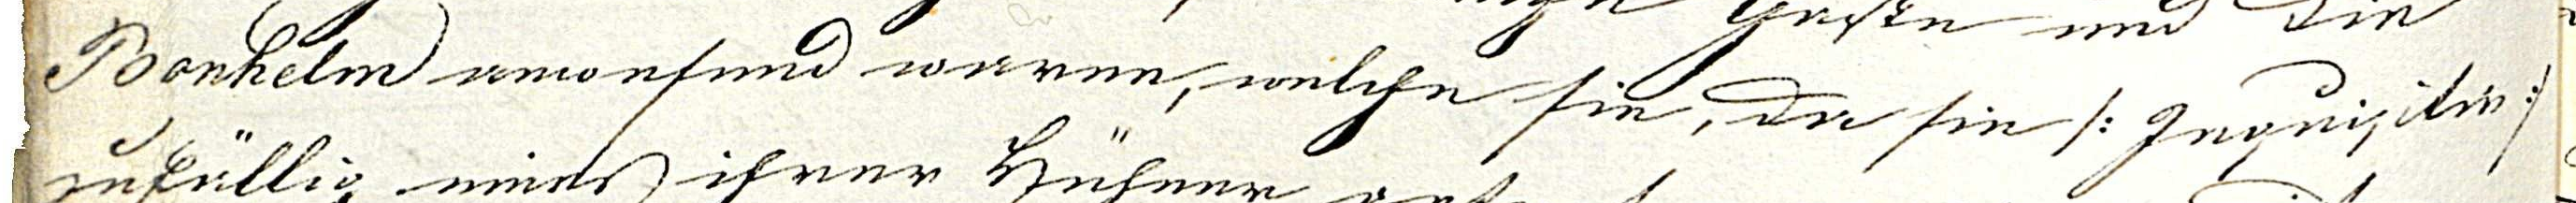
Bonhelm amonsend waren, welche sie, da sie /: Jnquisitin :/
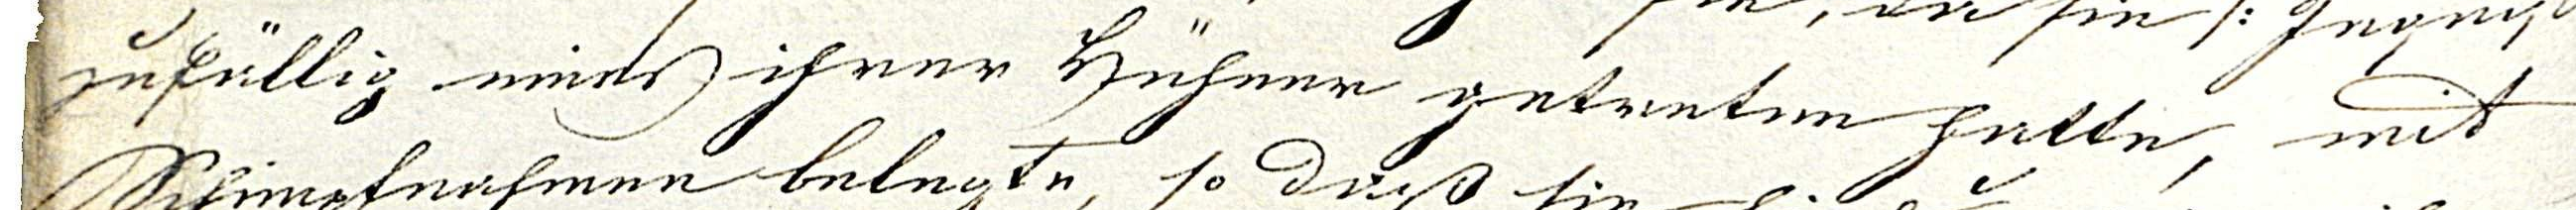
zufällig eines ihrer Hühner getreten hatte, mit
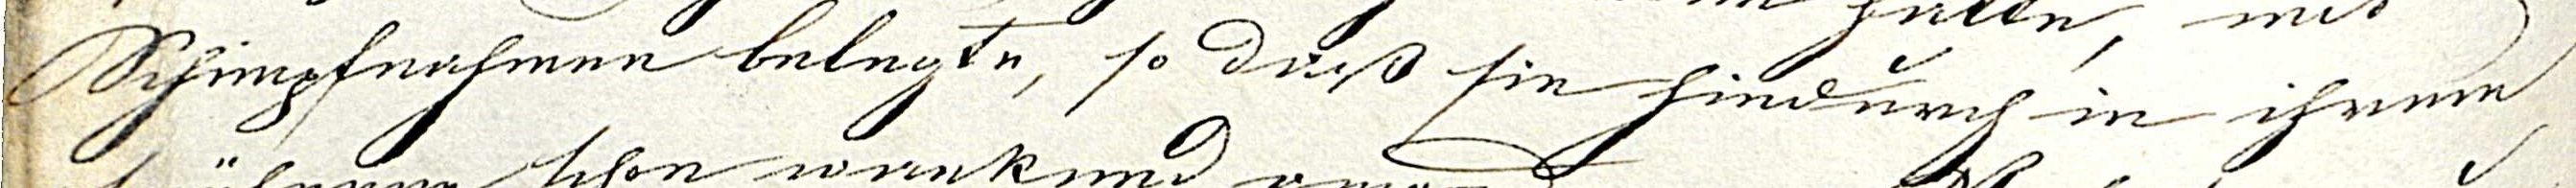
Schimpfnahmen belegte, so daß sie hindurch in ihrem
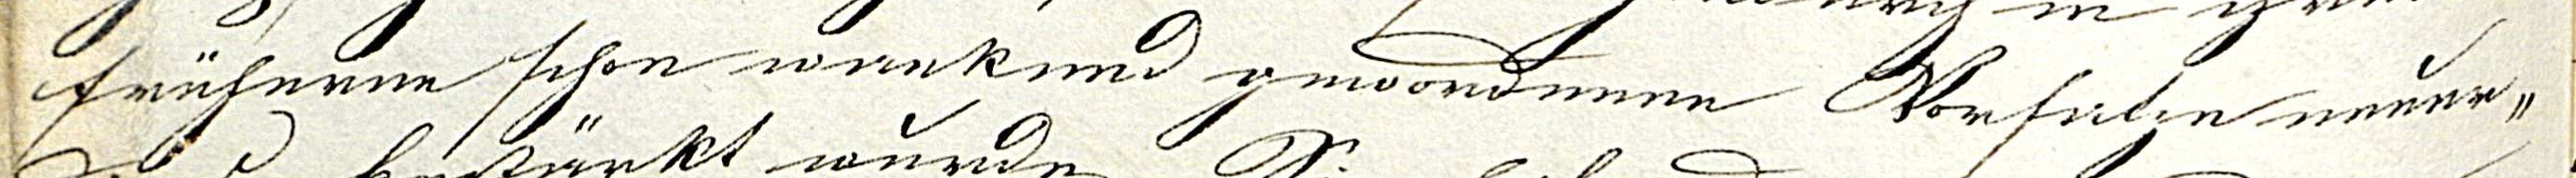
früheren schon wankend gewordenen Vorsitze neuer¬
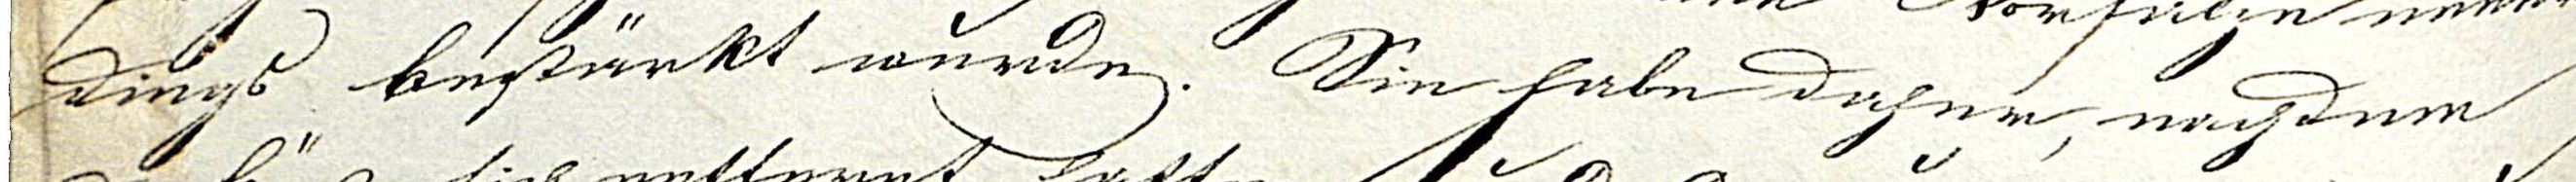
dings bestärkt wurde. Sie habe daher, nach dem
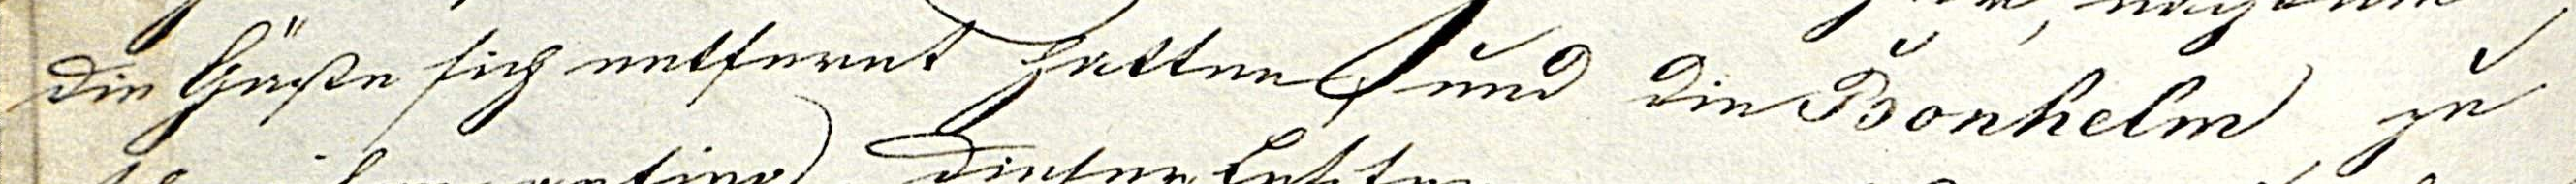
die Gäste sich entfernt hatten, und die Bonhelm zu
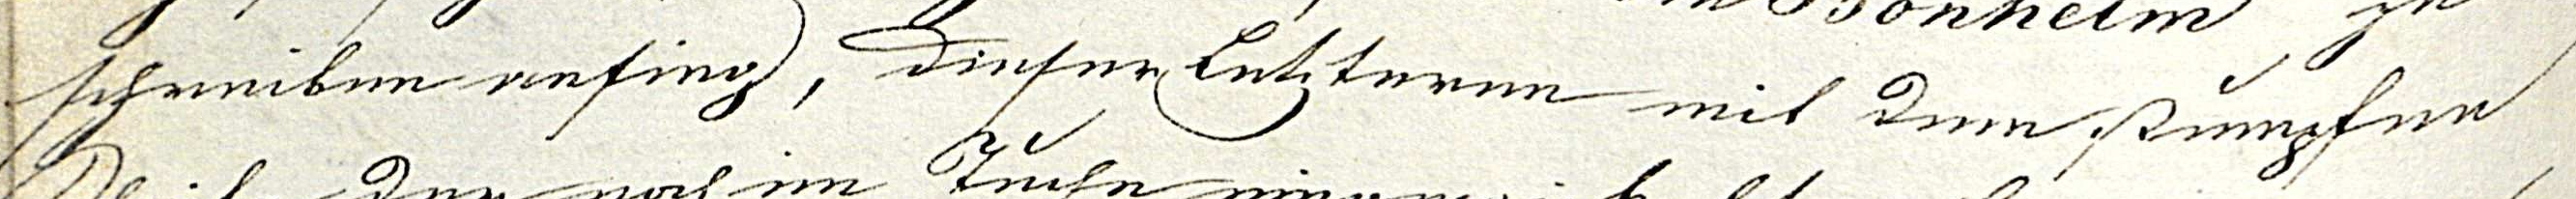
schreiben anfing, dieser Letzteren mit dem stumpfen
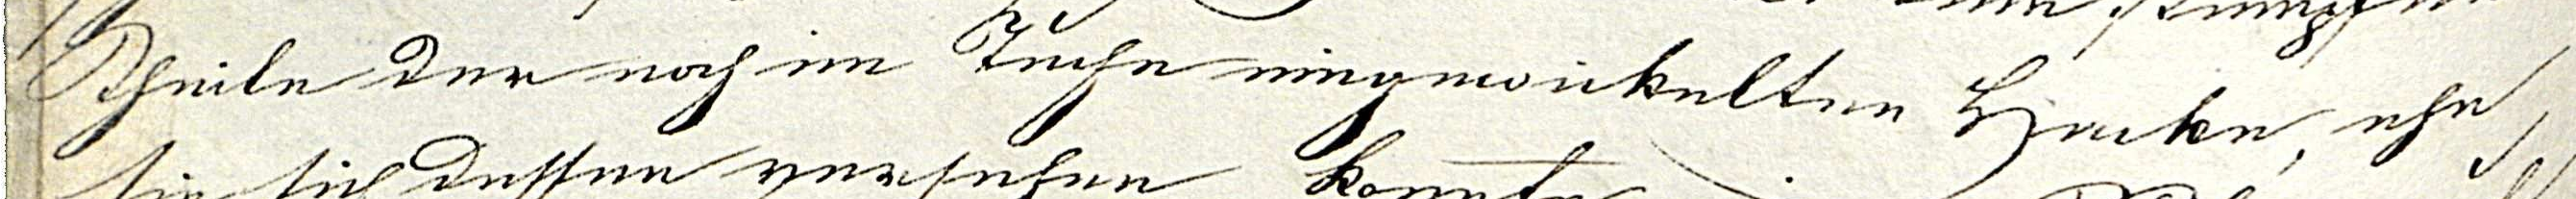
Theile der noch im Tuche eingewickelten Hacke, ehe
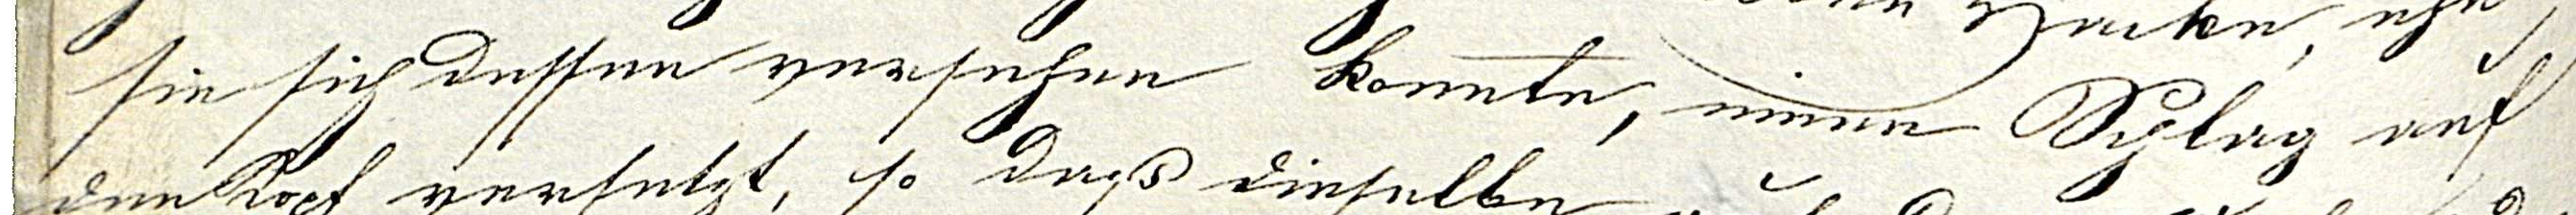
sie sich dessen versehen konnte, einen Schlag auf
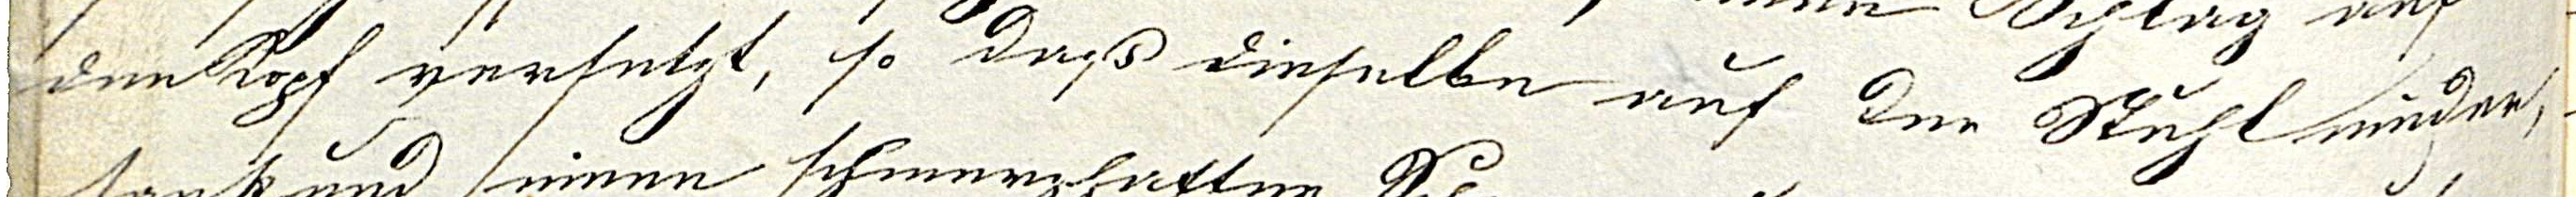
den Kopf versetzt, so daß dieselbe auf der Stuhl nieder,
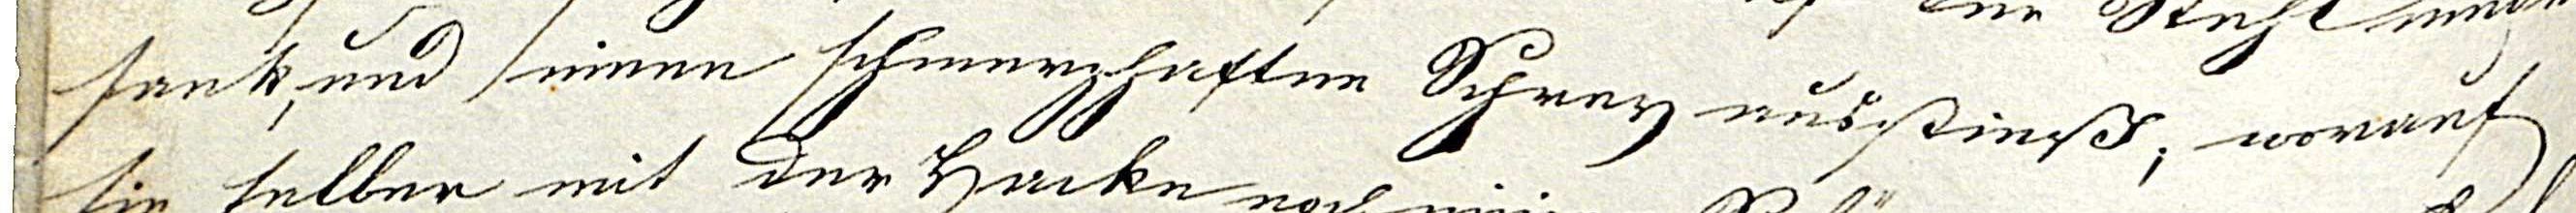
sank, und einen schmerzhaften Schwer ausstieß; worauf
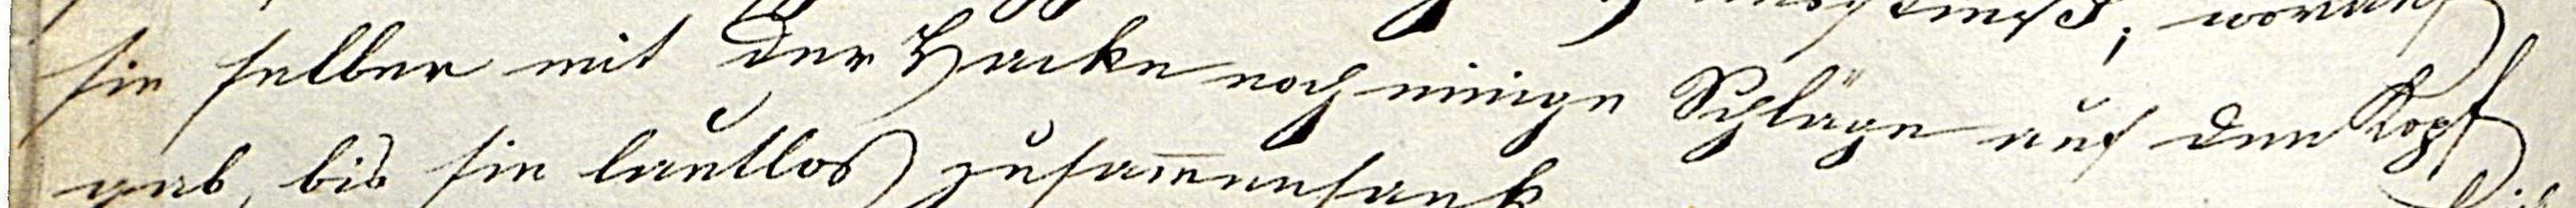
sie selber mit der Hacke noch einige Schläge auf dem Kopf
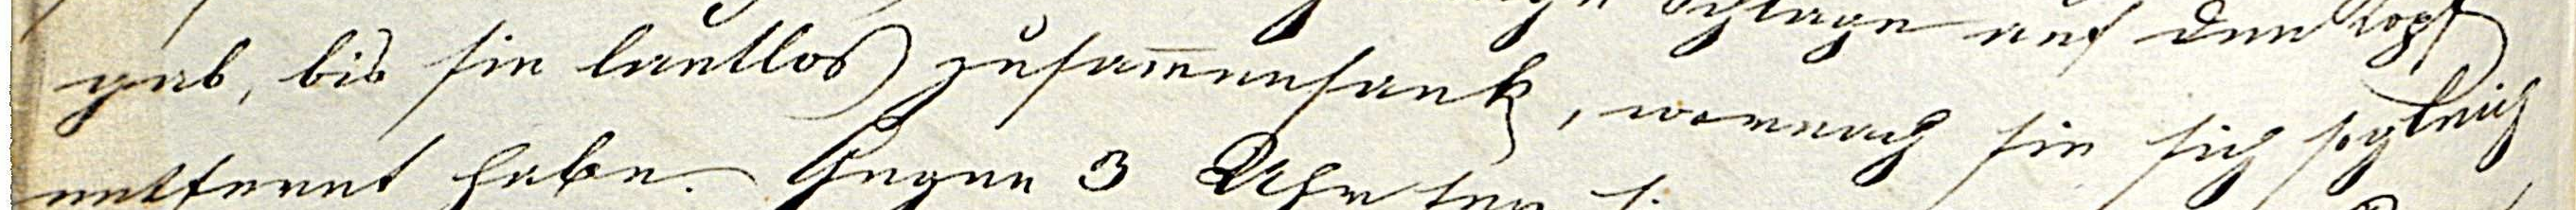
gab, bis sie lautlos zusammensank, wornach sie sich sogleich
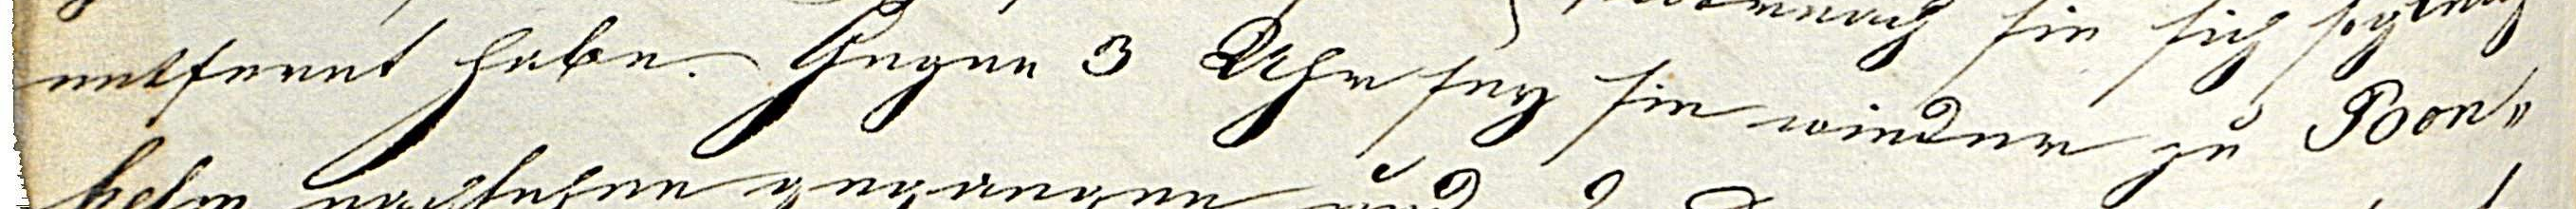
entfernt habe. Gegen 3 Uhr sey sie wieder zu Bon¬
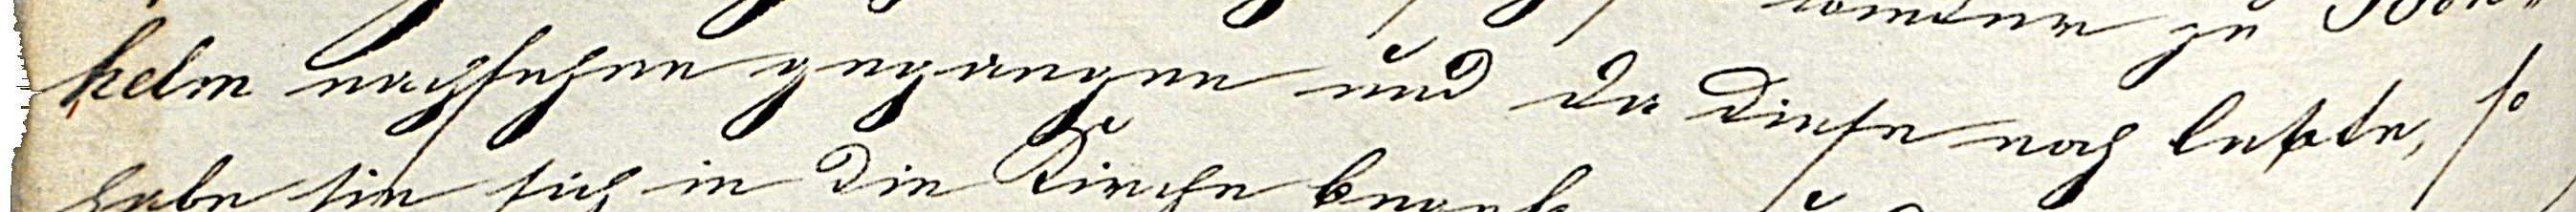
helm nachsehen gegangen und da diese noch lexx, so
